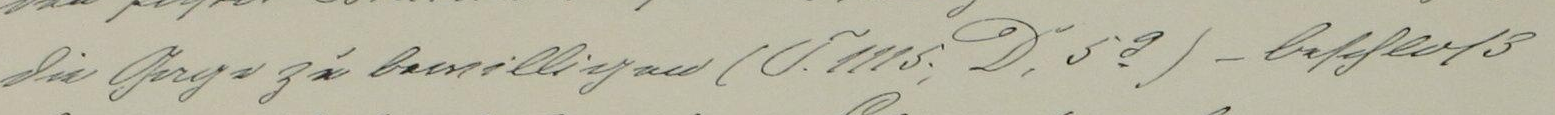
die Gage zu bewilligen (T.1115; D.5g) - beschloß
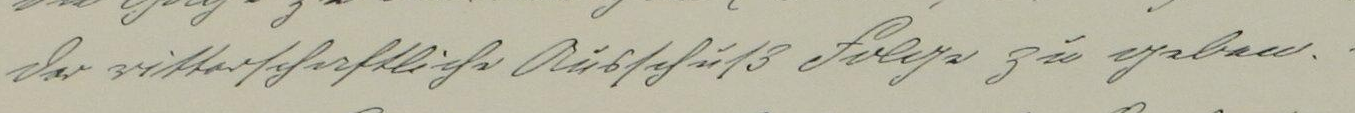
der ritterschaftliche Ausschuß Folge zu geben.
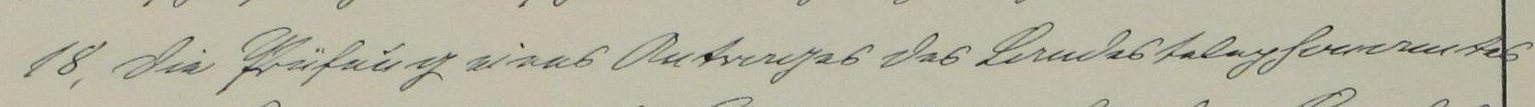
18. Die Prüfung eines Antrages des Landestelephonamtes
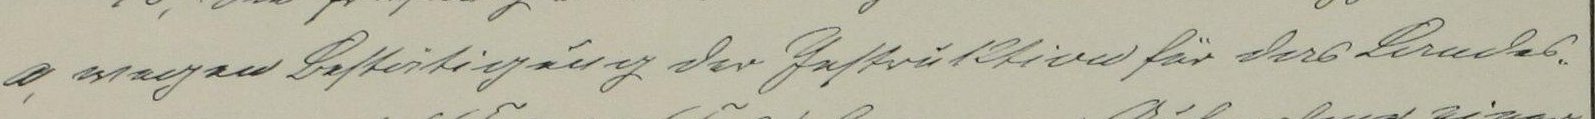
a. wegen Bestätigung der Instruktion für das Landes-
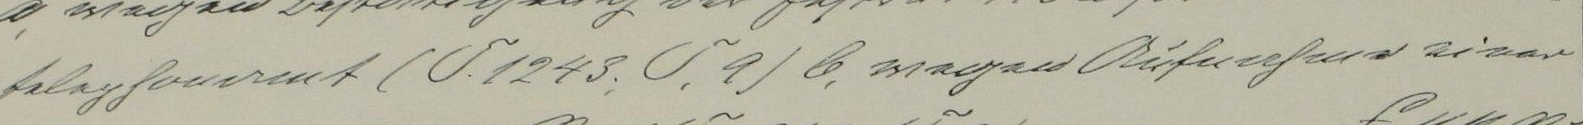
telephonamt (T.1243; T.9) b. wegen Aufnahme einer
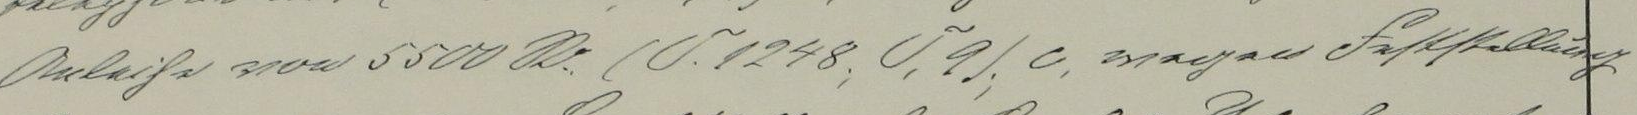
Anleihe von 5500 Ro. (T.1248; T.9). c. wegen Feststellung
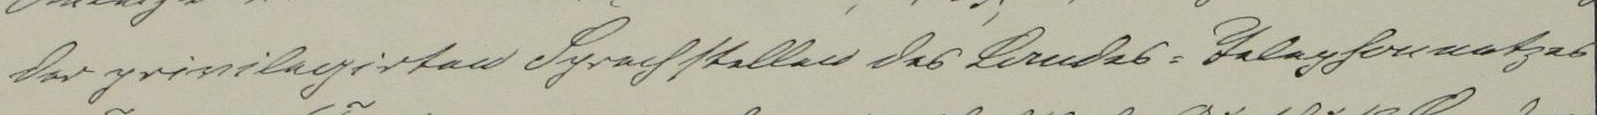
der privilegirten Sprechstellen des Landes-Telephonnetzes
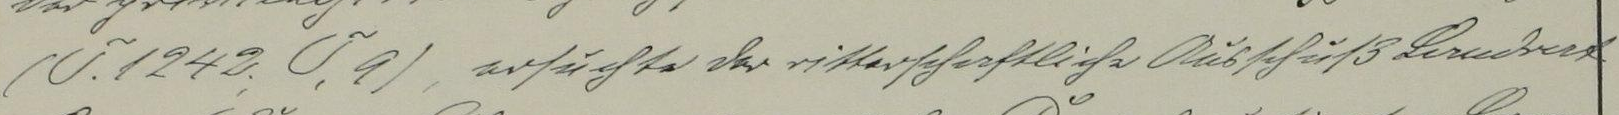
(T.1242; T.9) ersuchte der ritterschaftliche Ausschuß Landrat
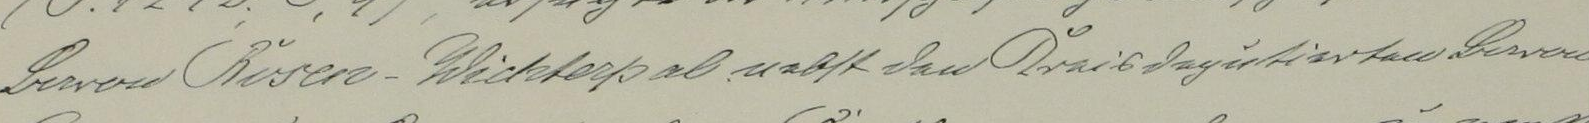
Baron Rosen-Wichterpal nebst den Kreisdeputierten Baron
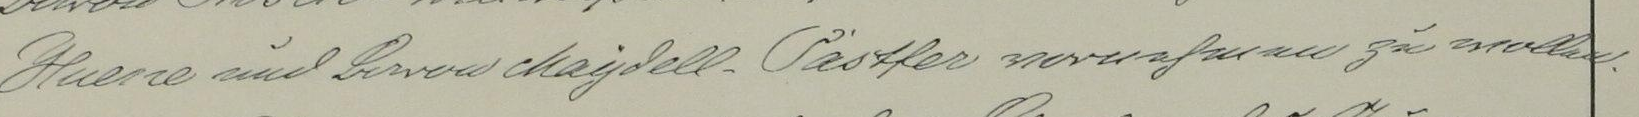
Huene und Baron Maydell-Pastfer vornehmen zu wollen.
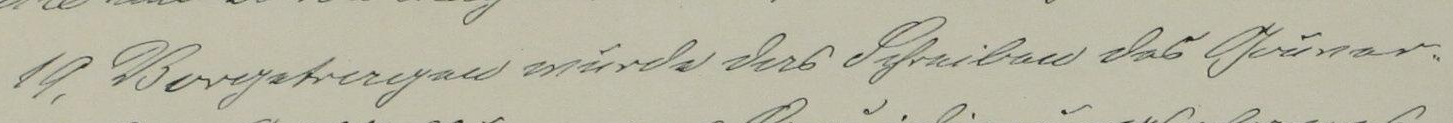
19. Vorgetragen wurde das Schreiben des Gouver-
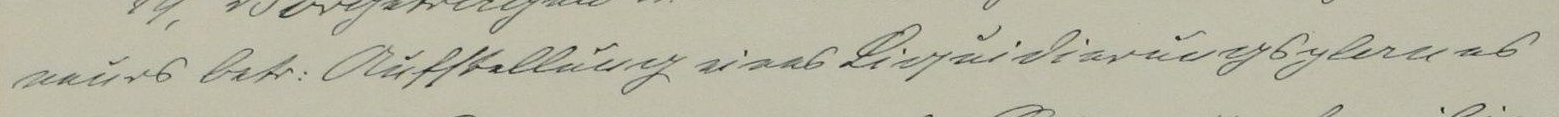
neurs betr. Aufstellung eines Liquidierungsplanes
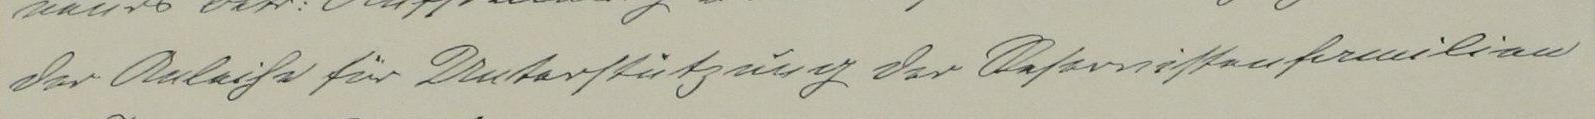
der Anleihe für Unterstützung der Reservistenfamilien
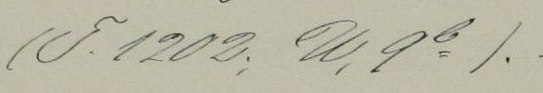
(T.1202; U.9b).
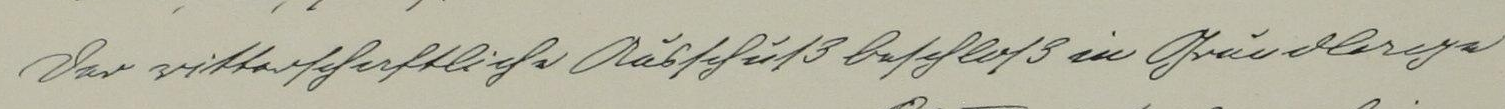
Der ritterschaftliche Ausschuß beschloß in Grundlage
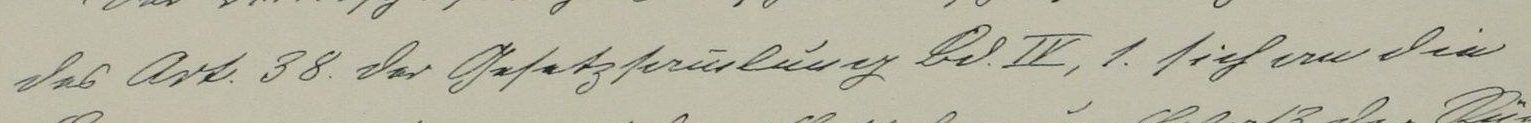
des Art. 38 der Gesetzsammlung Bd.IV, 1. sich an die
